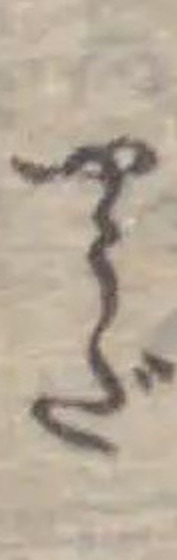やうだ
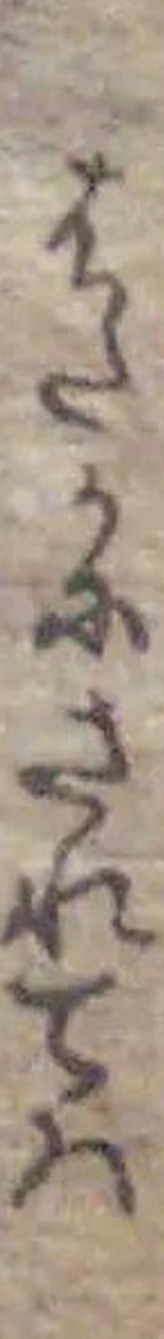はたかにされては
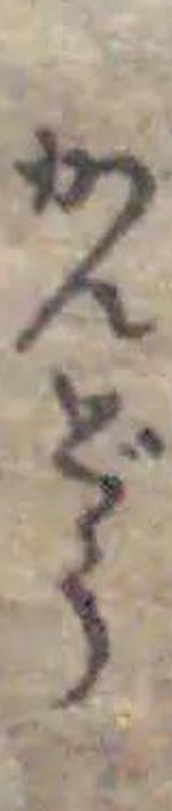かんどう

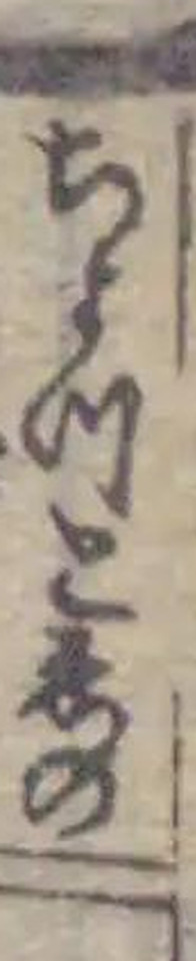ちよつとこゑの
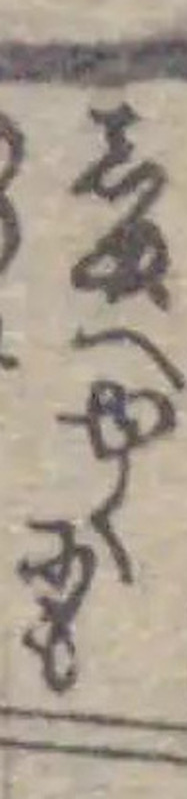しまへゆくにも
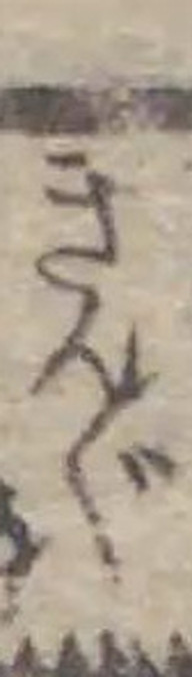きん〴〵
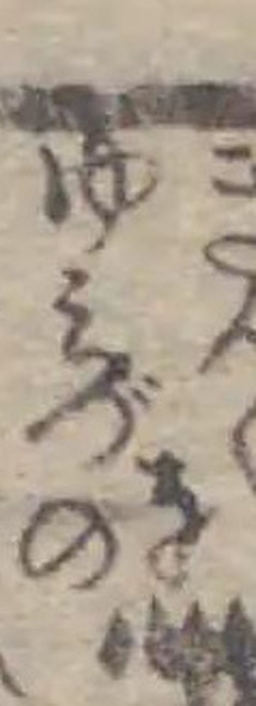ゆみづの
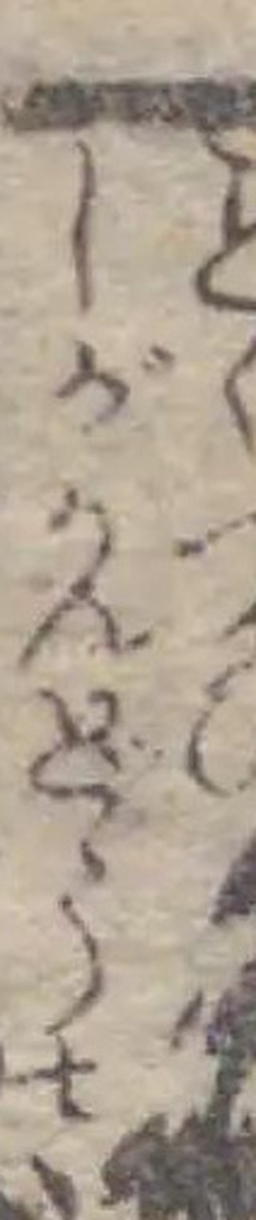しがかんどうの
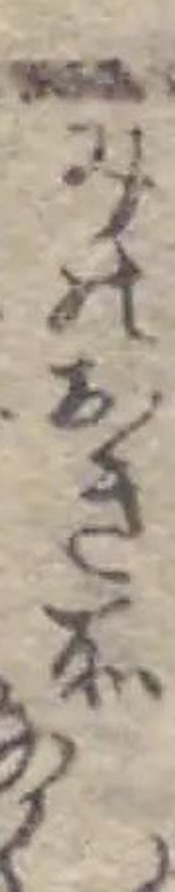みのおき所なく
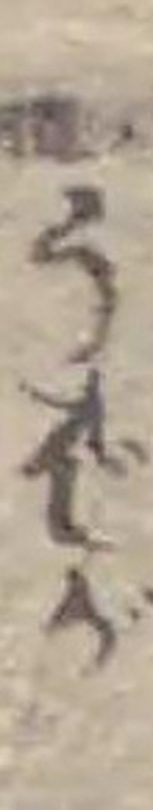うばが
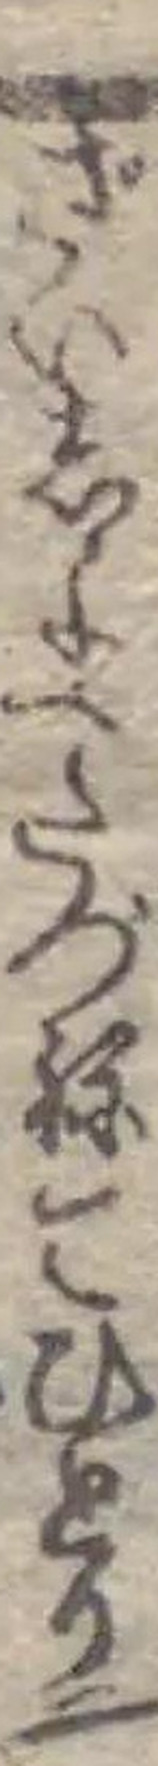ざいしよへたづねこひとり
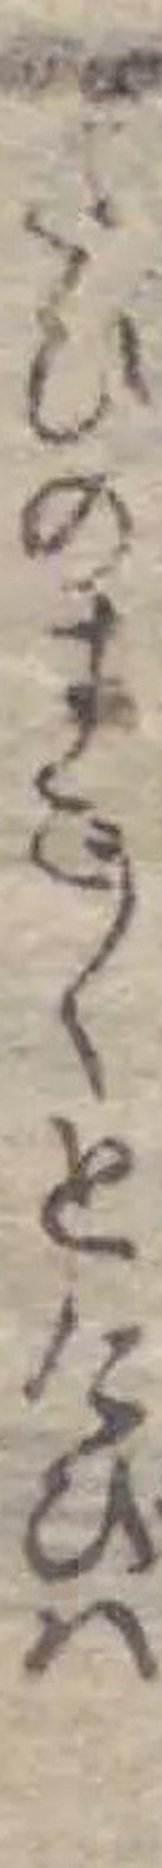たひのすご〳〵とたびは
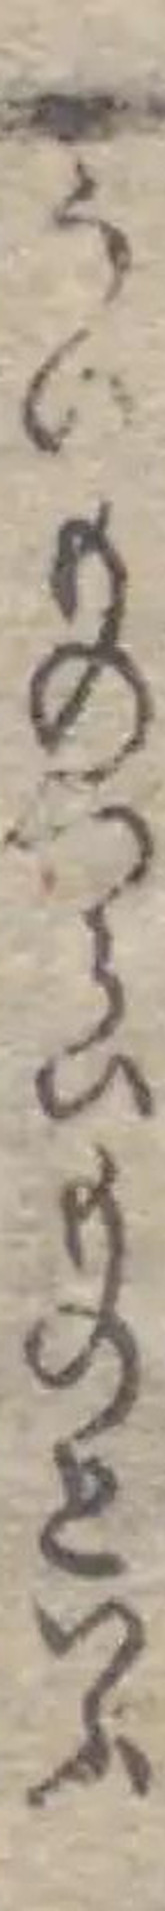ういものつらいものといふ
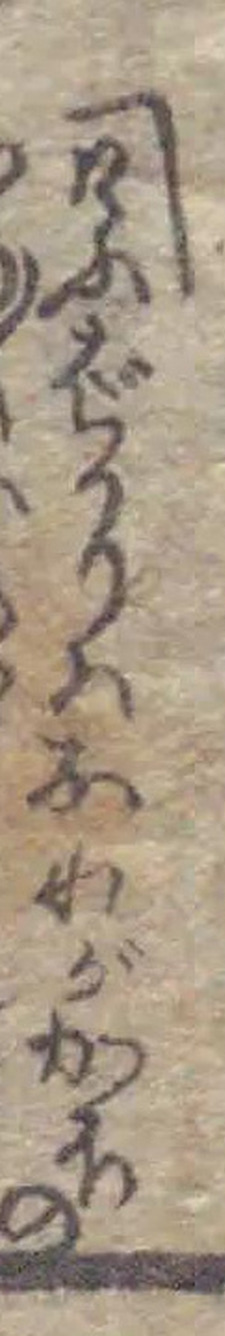〽けふばかりはおれがかほの
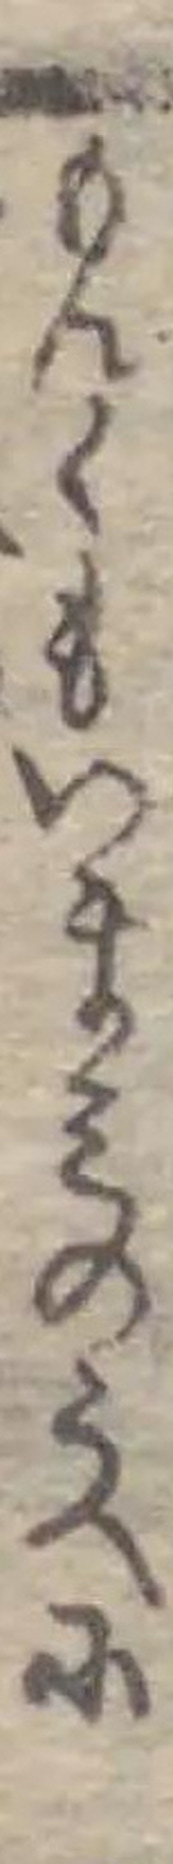もんくもいまみのうへに
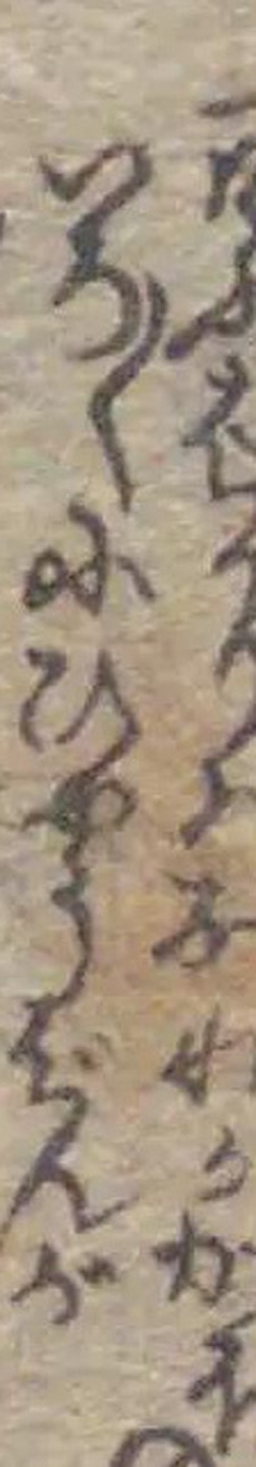いろ〳〵にひやうばんが
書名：福壽海旡量品玉 3巻
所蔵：国立国会図書館 National Diet Library, JAPAN
